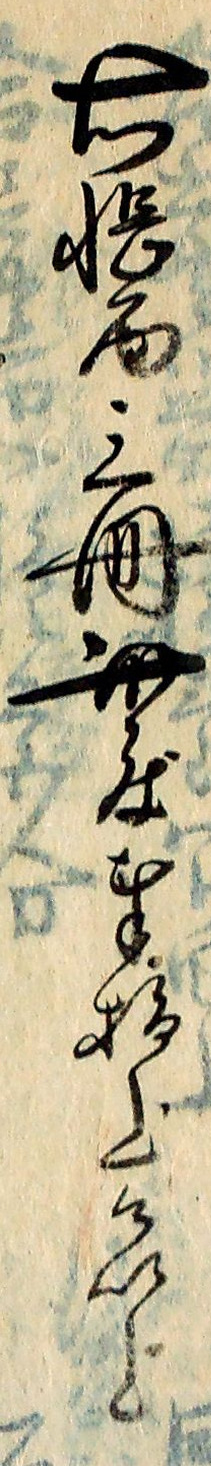右帳面三冊此度奉指上候以上
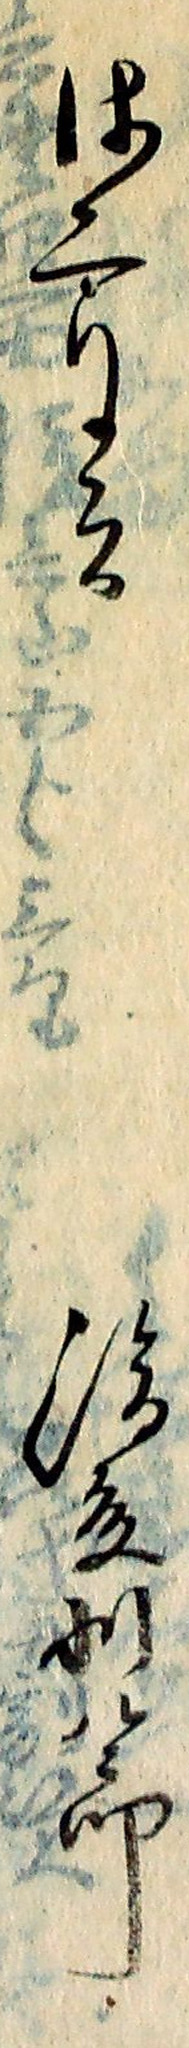戌二月二日後藤利八郎
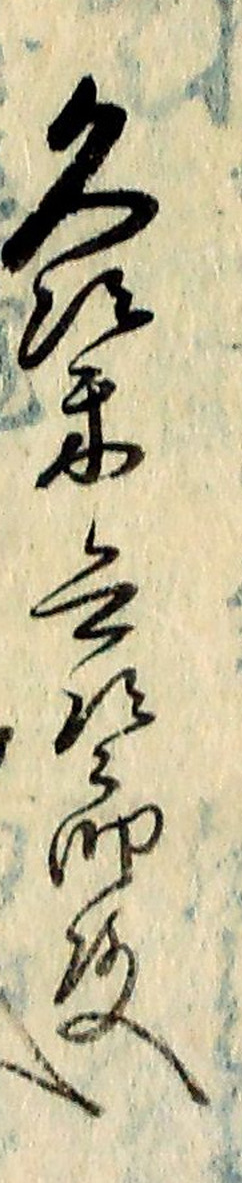久須米兵次郎殿
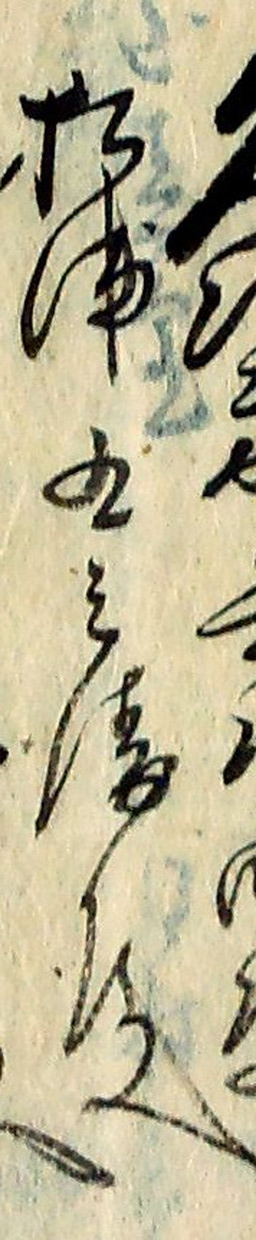松浦九兵衛殿
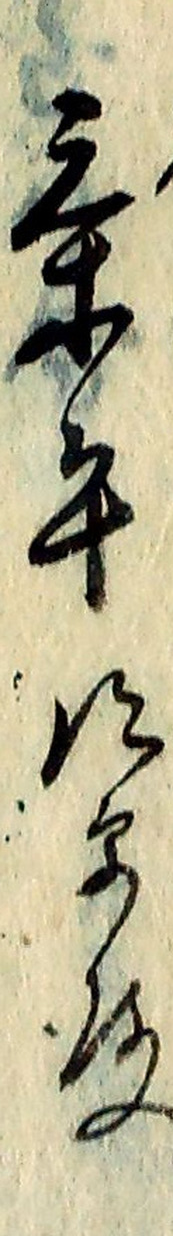元木平次衛殿

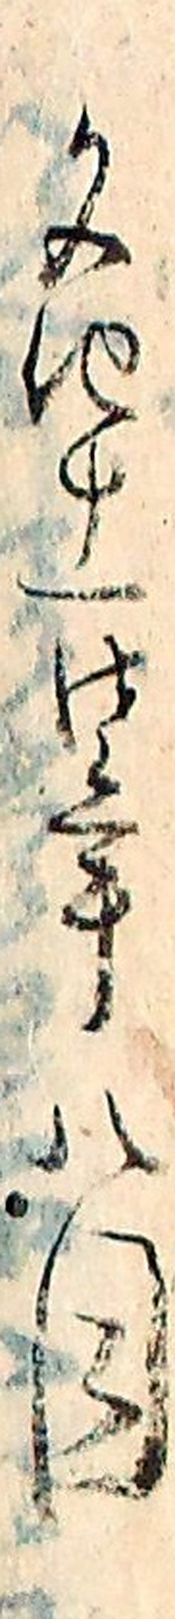文化十一戌年八月
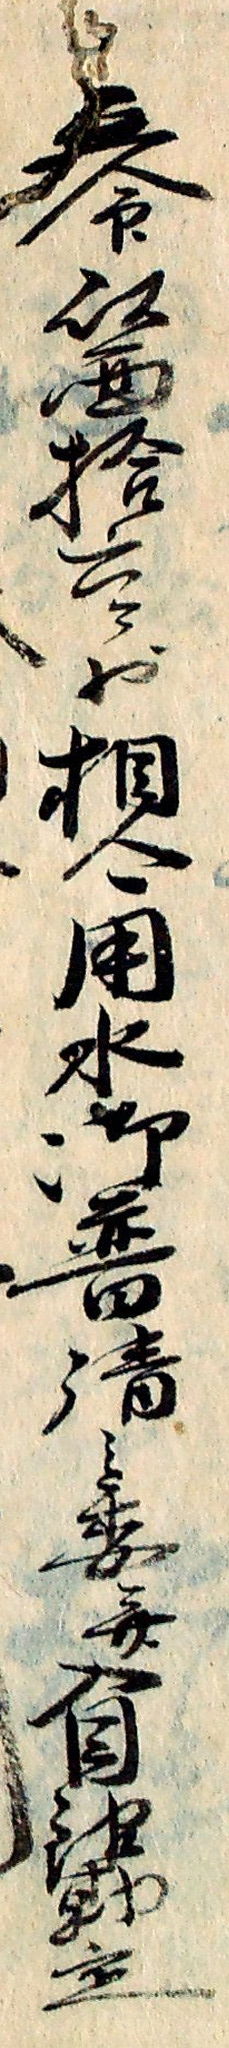延命以西拾六ヶ村相合用水御普請之委并入目銀勘定
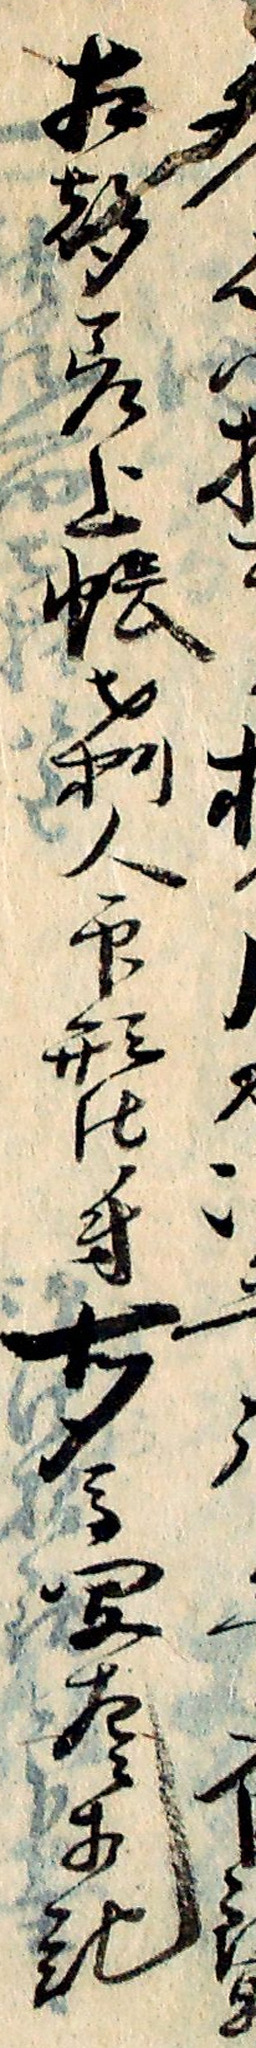相都〆差上帳才判人印形仕候付右〆高写左に相記
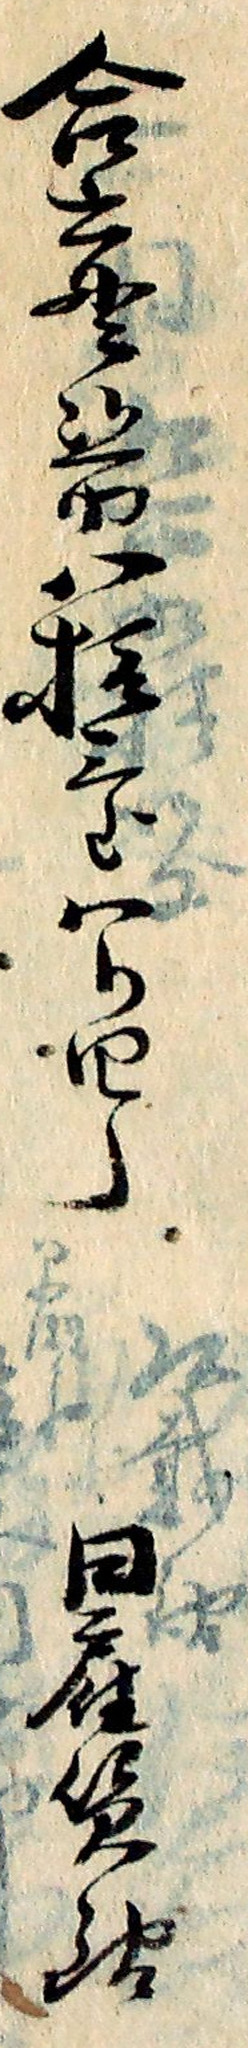合六貫弐百八拾三匁八分四厘日雇賃銀
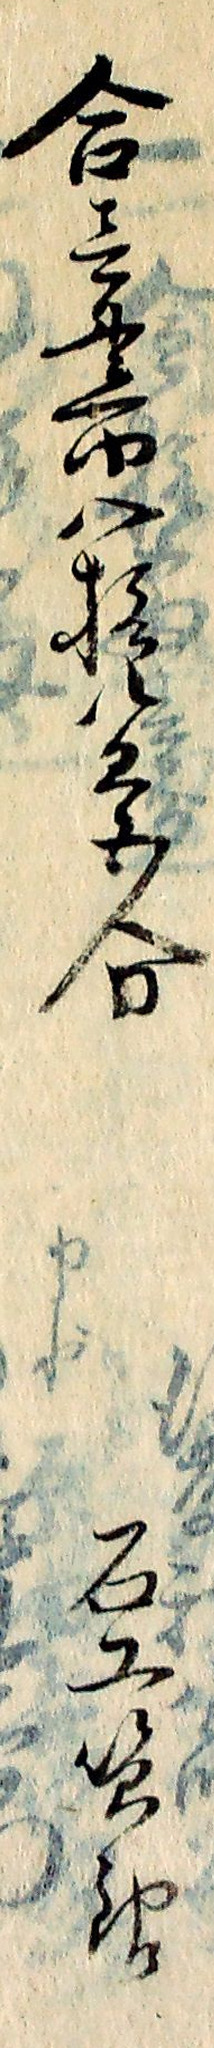合壱貫百八拾八匁五分石工賃銀
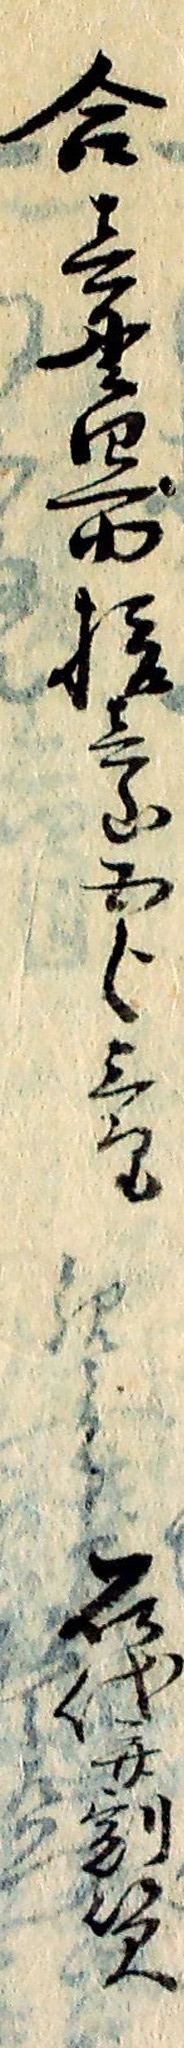合壱貫四百拾壱匁五分三厘石代并割賃
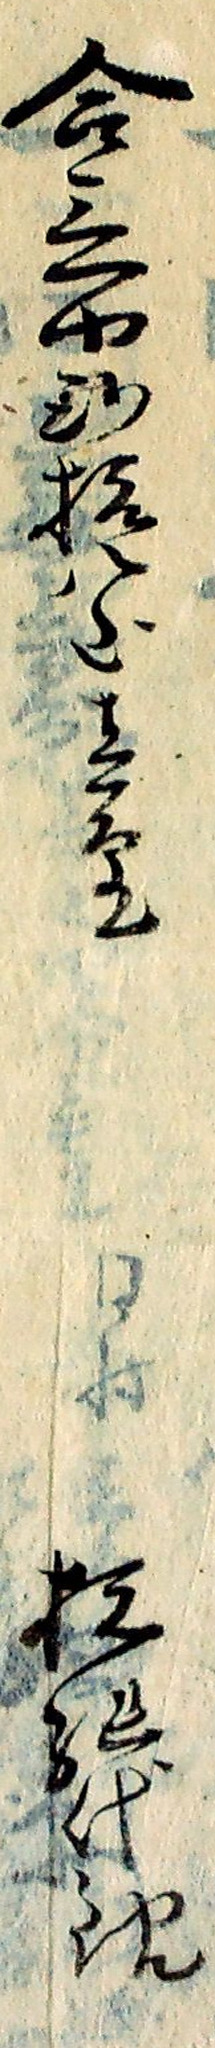合三百弐拾八匁壱厘杭継代銀
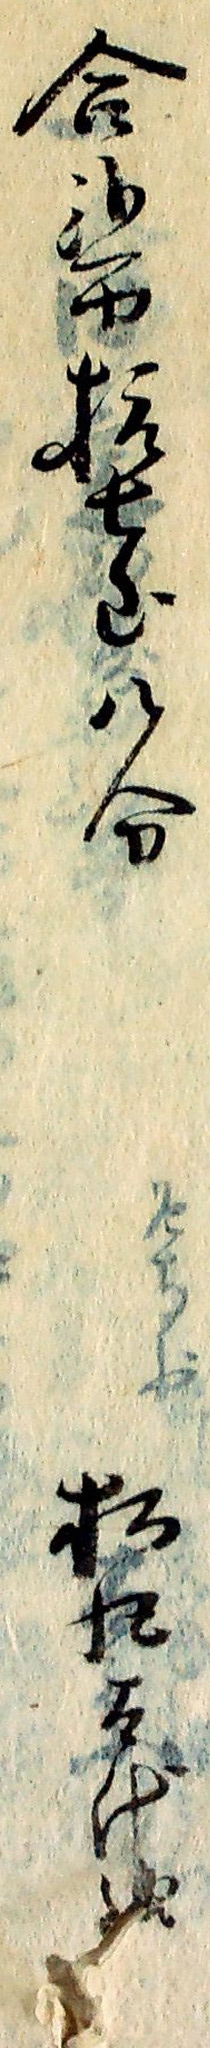合弐百拾七匁八分松丸太代銀
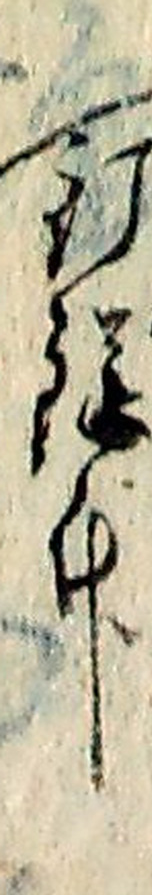釘鎹代
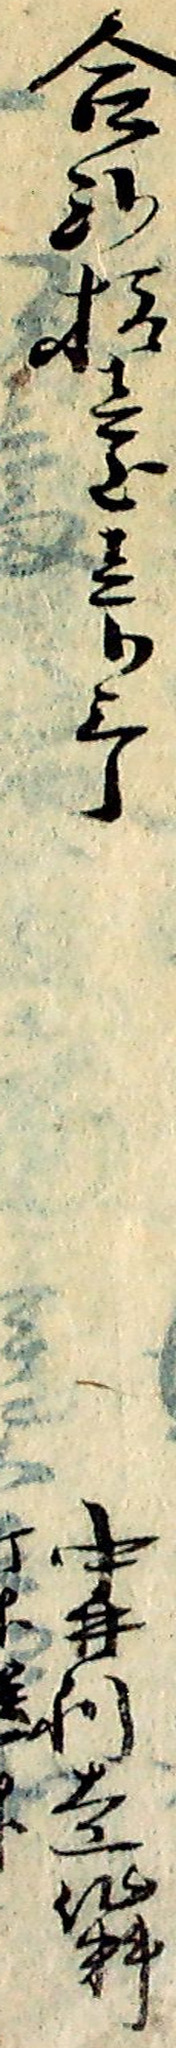合弐拾壱匁壱分三厘中井川大工作料
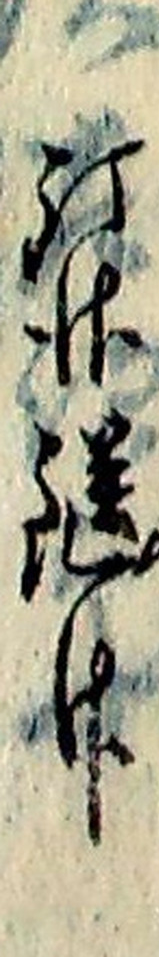釘代鎹代
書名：諸御願書控(後藤氏壱番）
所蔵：鳴門教育大学 Naruto University of Education
